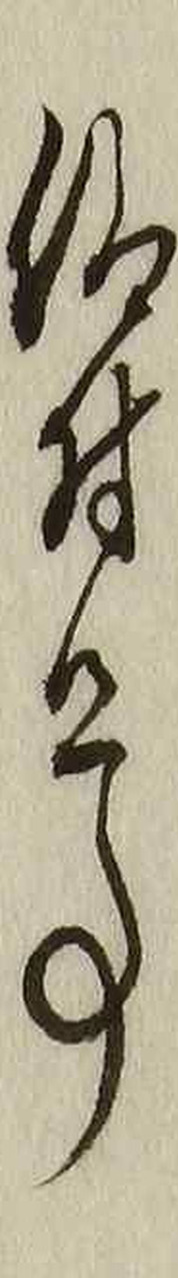仰付候事
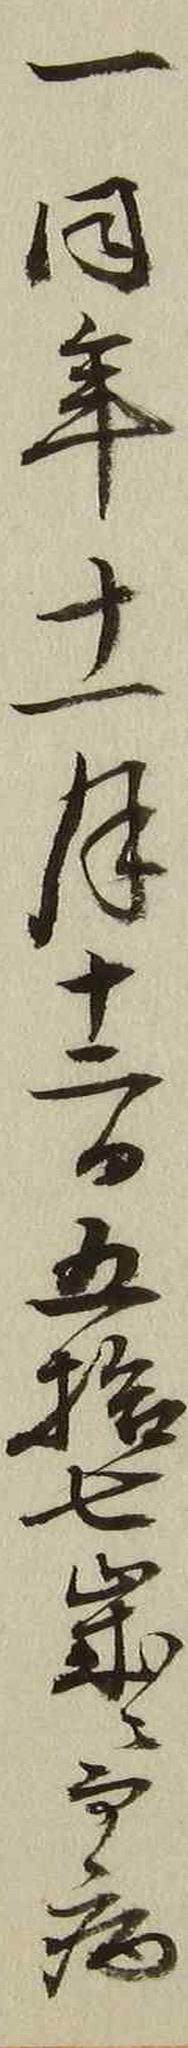一同年十一月十二日五拾七歳ニ而病
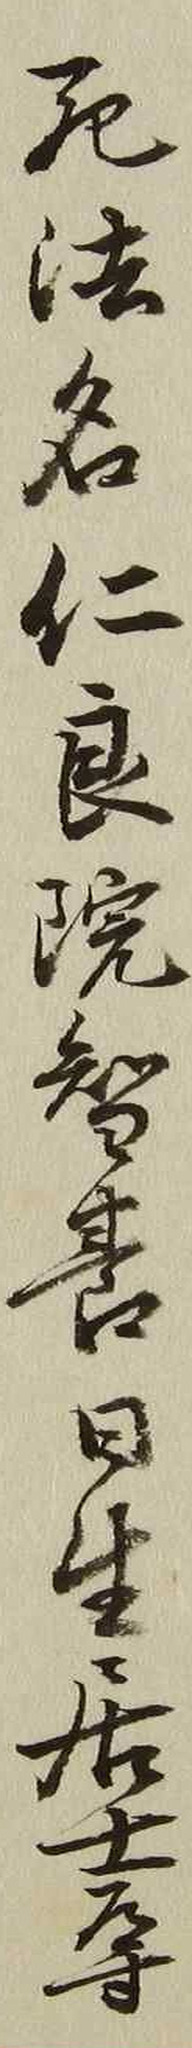死法名仁良院智養日生居士導
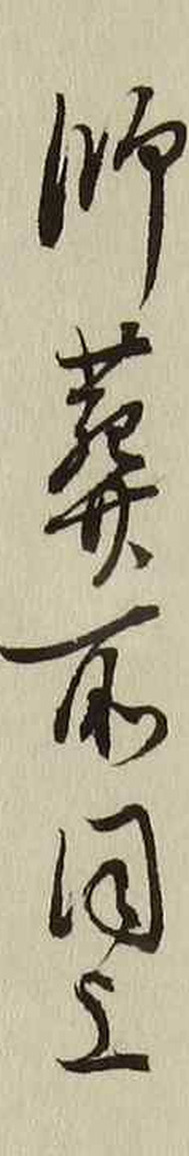師葬所同上
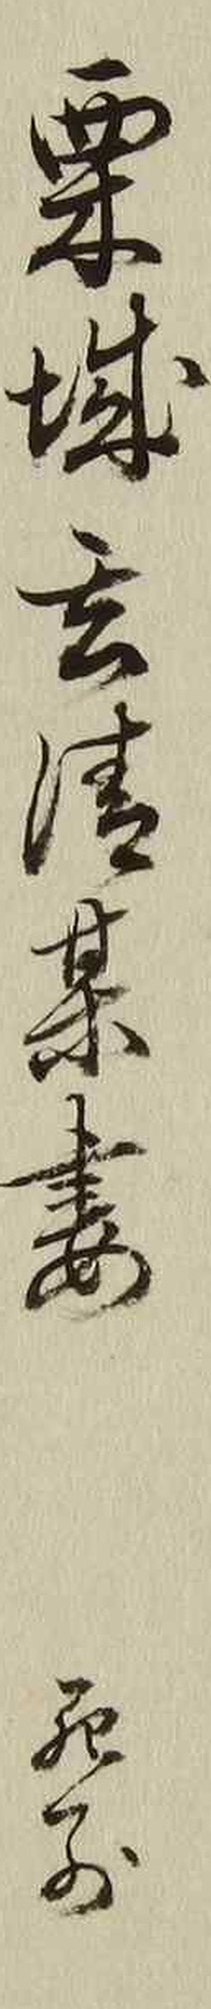女栗城玄清某妻死別
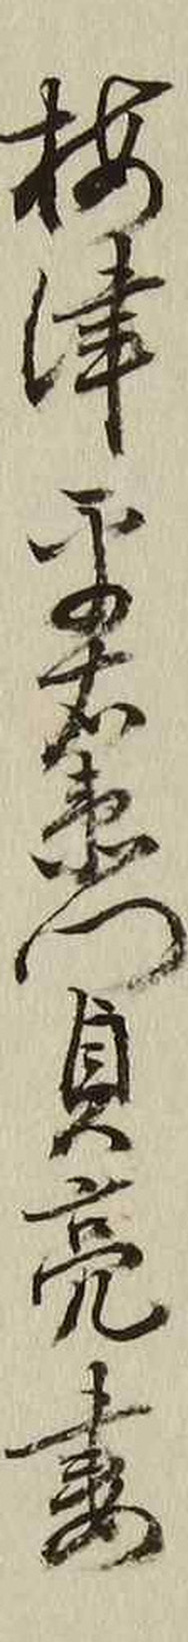梅津平右衛門貞亮妻
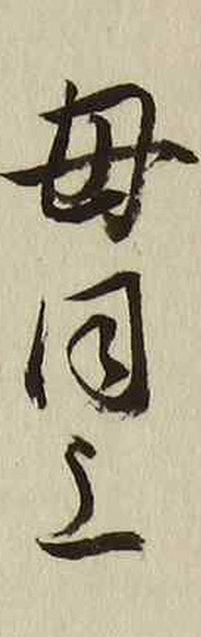母同上
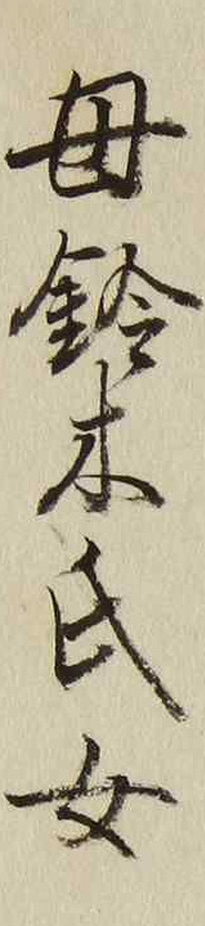母鈴木氏女

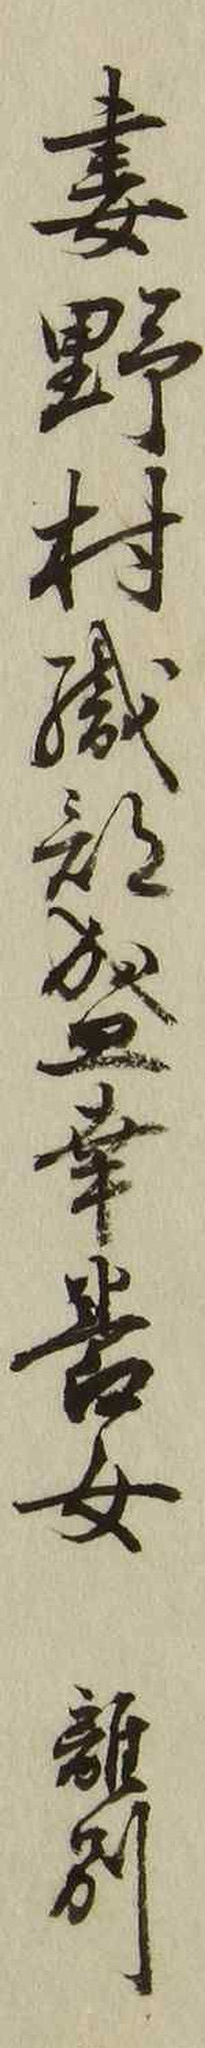妻野村織部盛幸養女離別
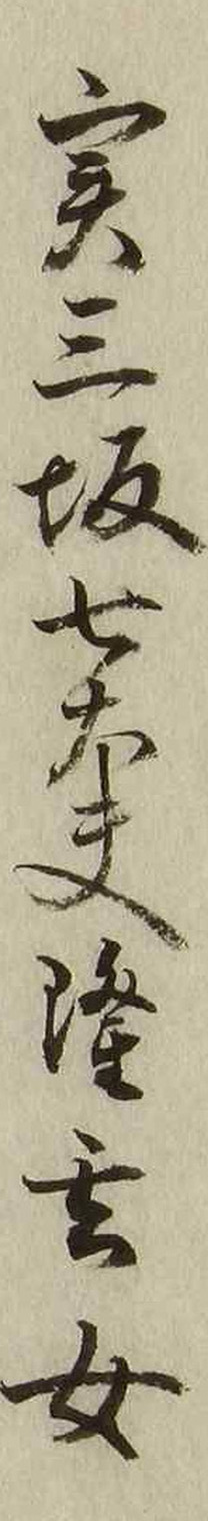実三坂七大夫隆玄女
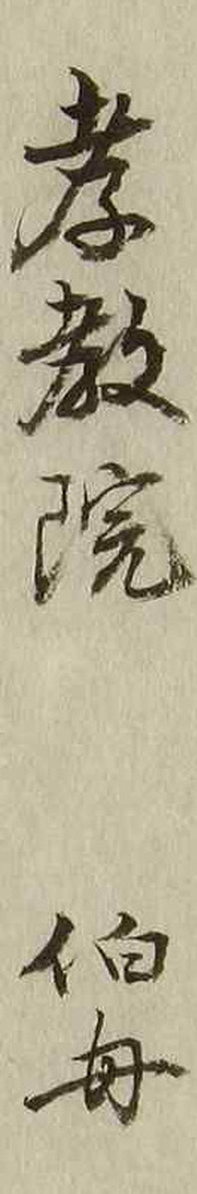孝教院伯母
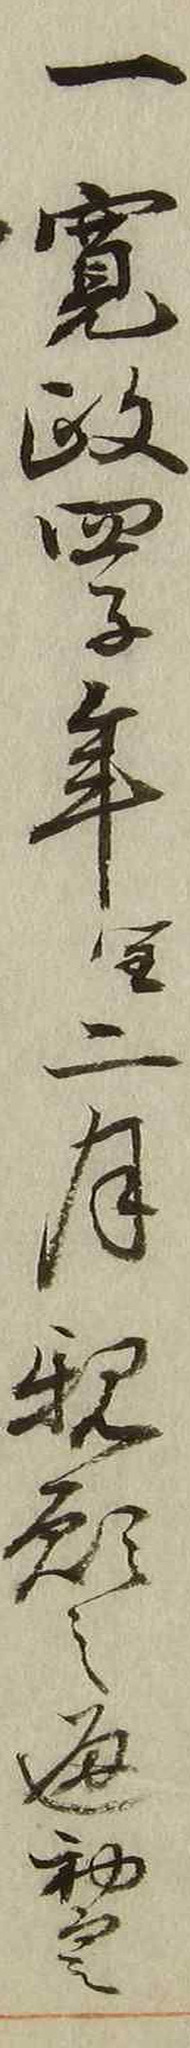一寛政四子年閏二月親願之通初而之
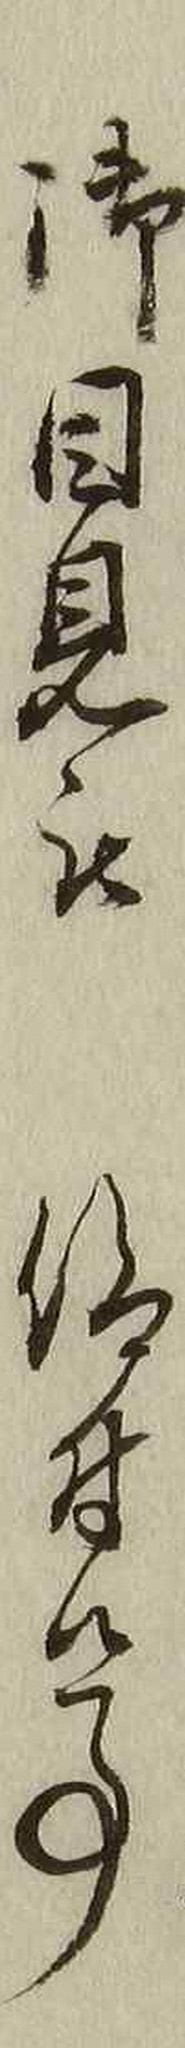御目見被仰付候事
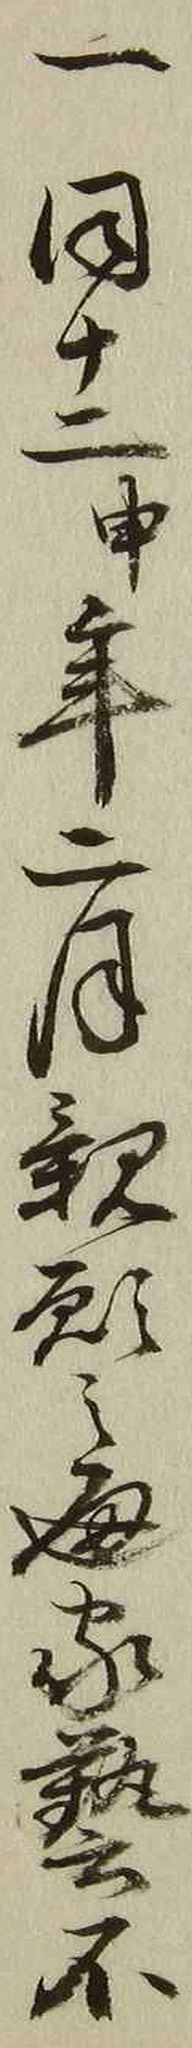一同十二申年二月親願之通家芸不
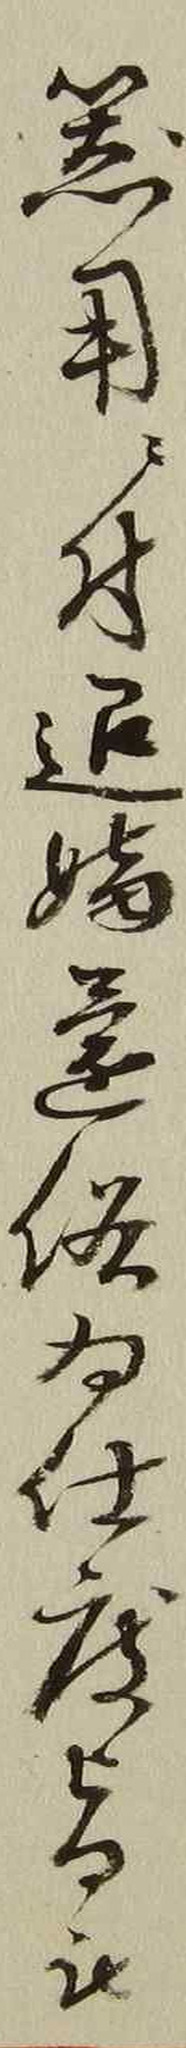器用ニ付退嫡遠俗為仕度旨被
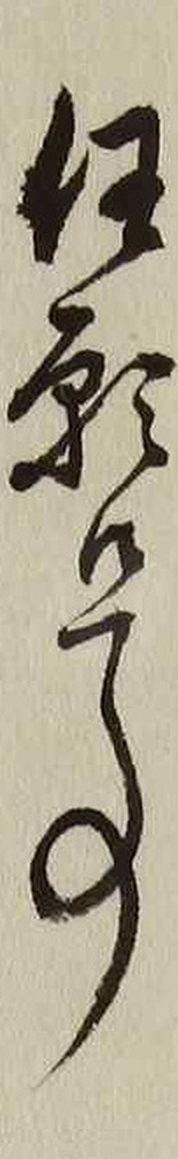任願候事
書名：諸士系譜　巻之39　は之部7
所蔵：会津若松市立会津図書館
